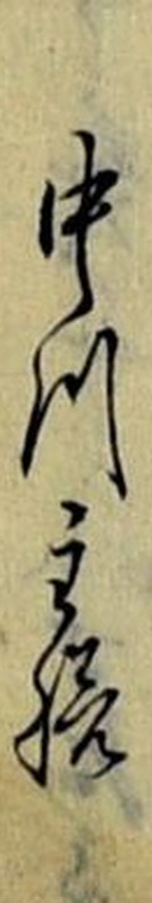中川主膳
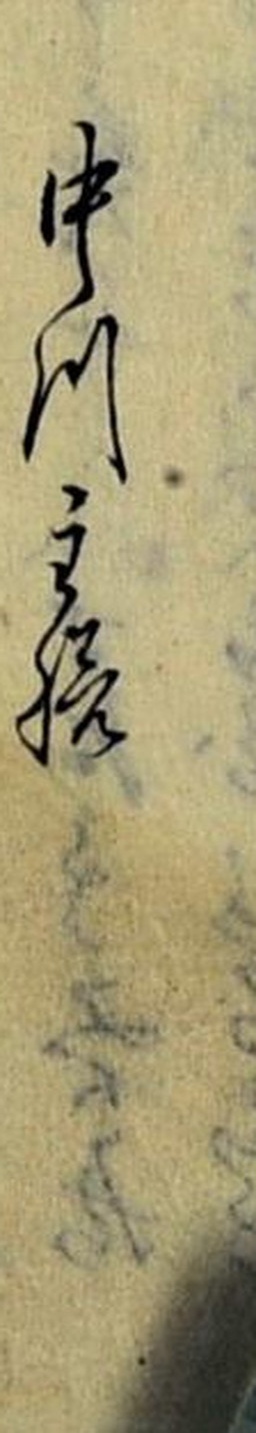中川主膳
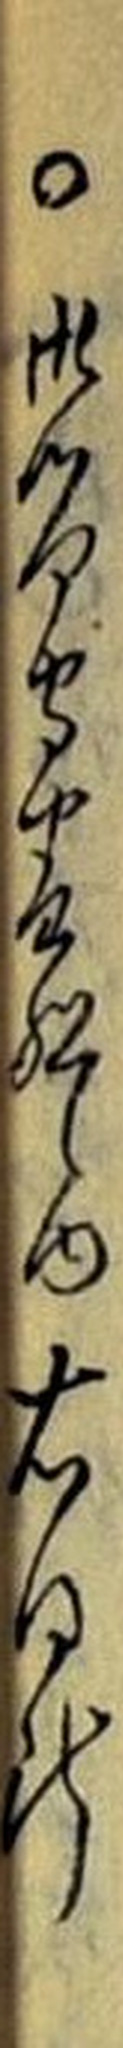○御留守番組之内右同断
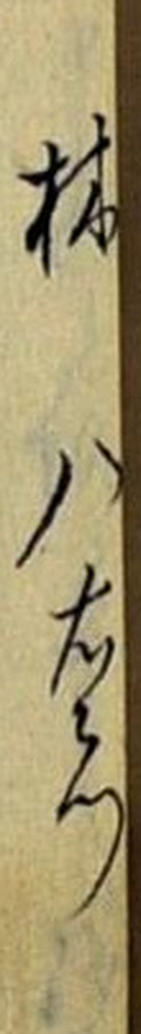林八右衛門
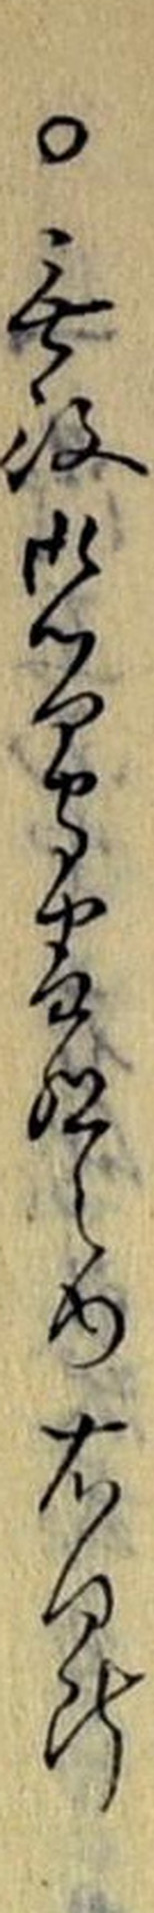○無役御留守番組之内右同断
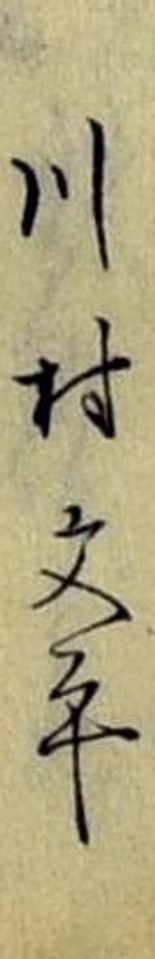川村文平
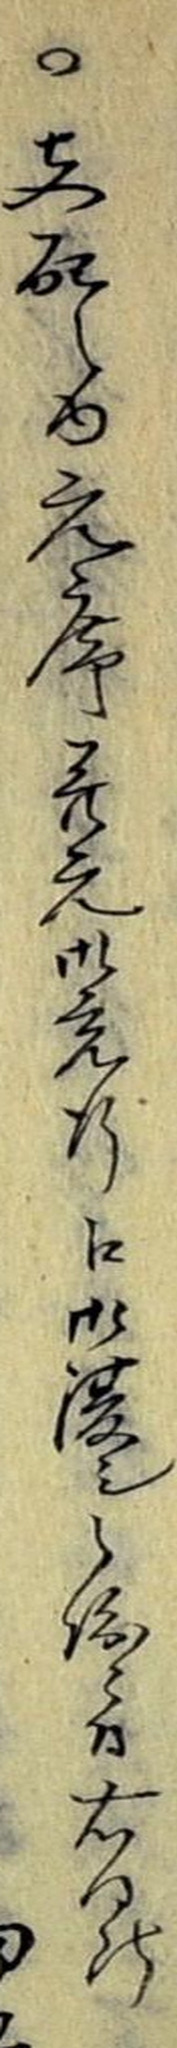○支配之内元席井元御充行江御復し之儀に付右同断
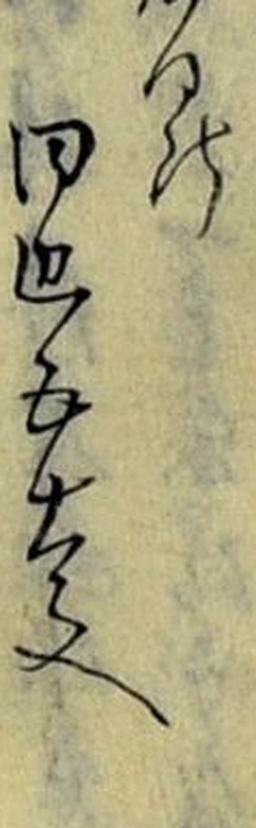田辺五太夫
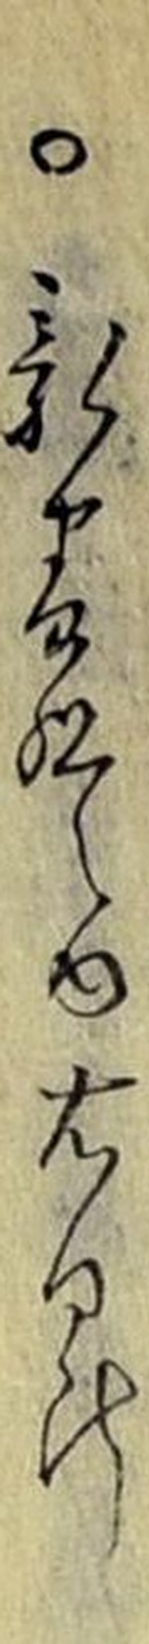○新番組之内右同断
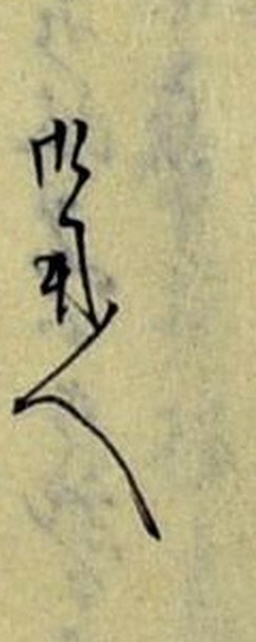御用人
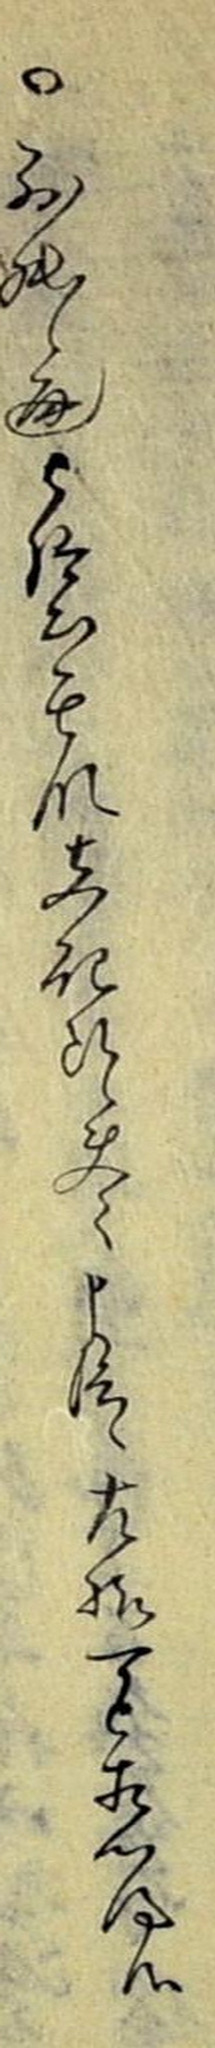○別紙之通被仰出候其段支配頭へ夫々申渡候左様可被相心得候
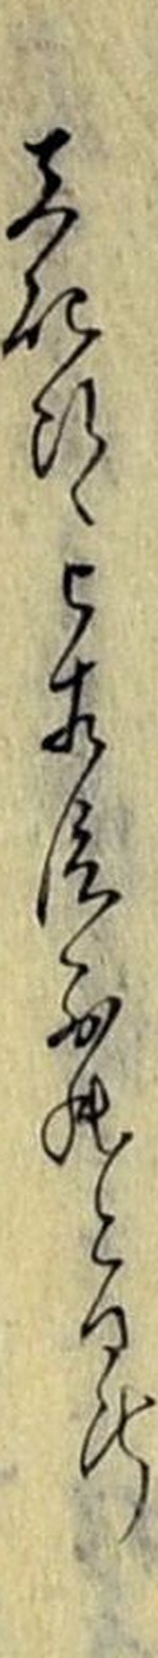支配頭へ被相渡別紙と同断
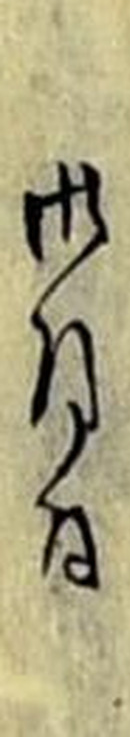御目付
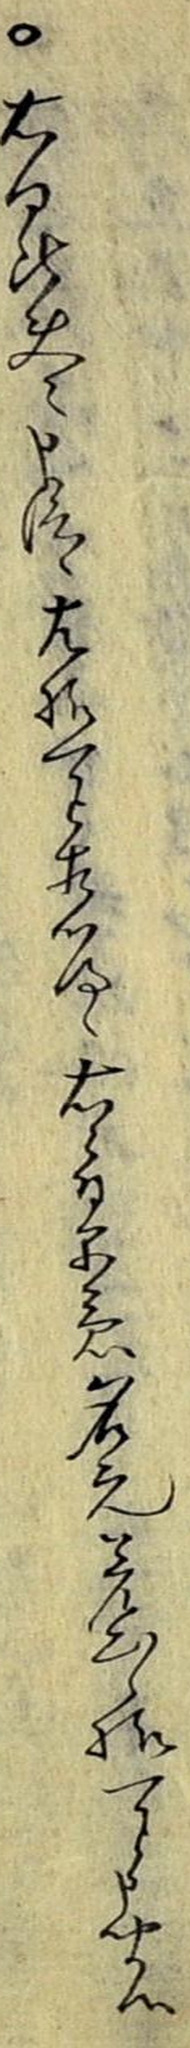○右同断夫々申渡候左様可被相心得候右に付早急名元差出候様可被申聞候
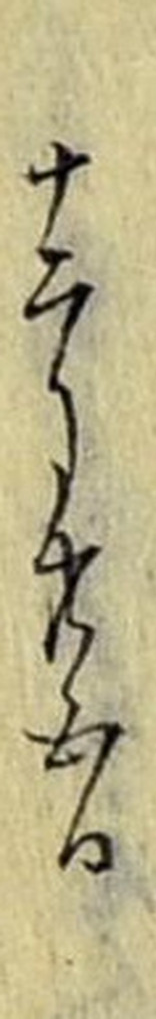十二月廿五日

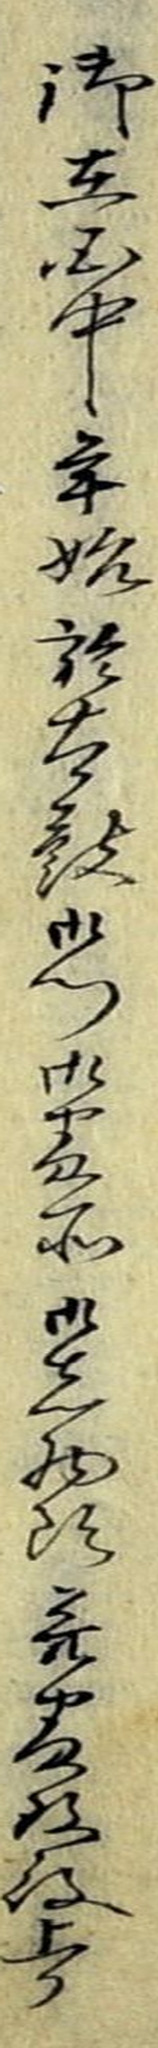御在国中年始於太鼓御門御番所御先物頭井番改役上り
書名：命令之部 六
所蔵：福井県文書館 Fukui Prefectural Archives
